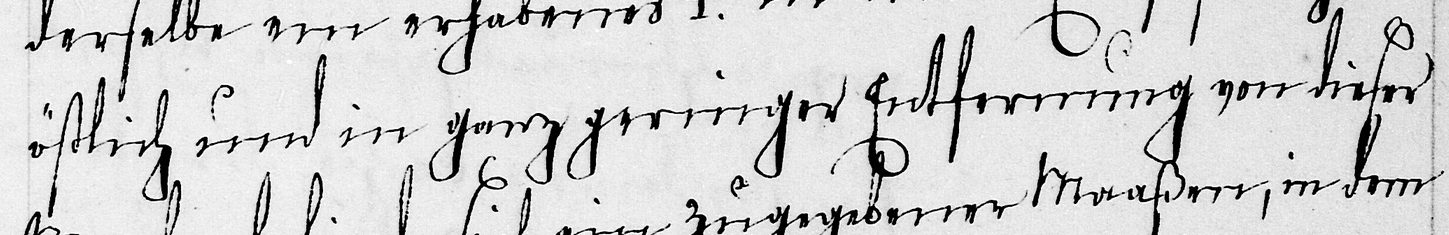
östlich und in ganz geringer Entfernung von dieser
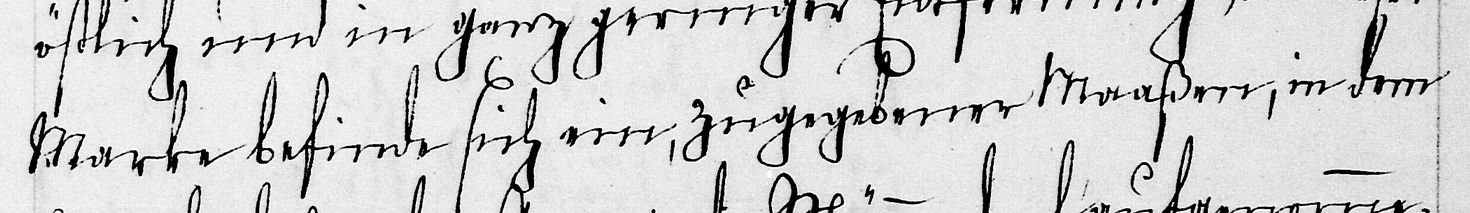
Marke befinde sich ein, zugegebener Maaßen, in dem
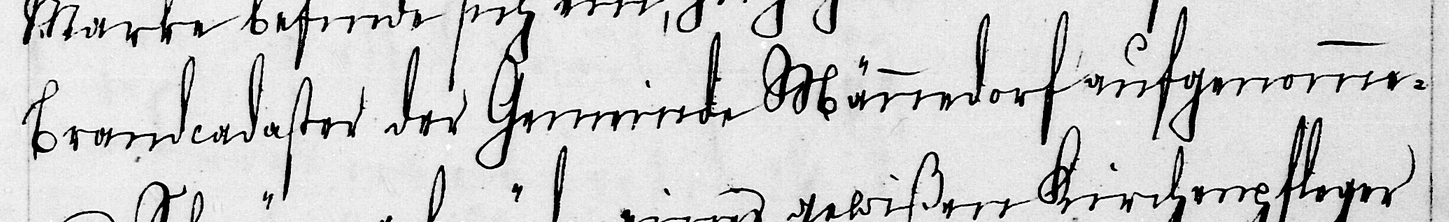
Brandcadaster der Gemeinde Männedorf aufgenomme¬
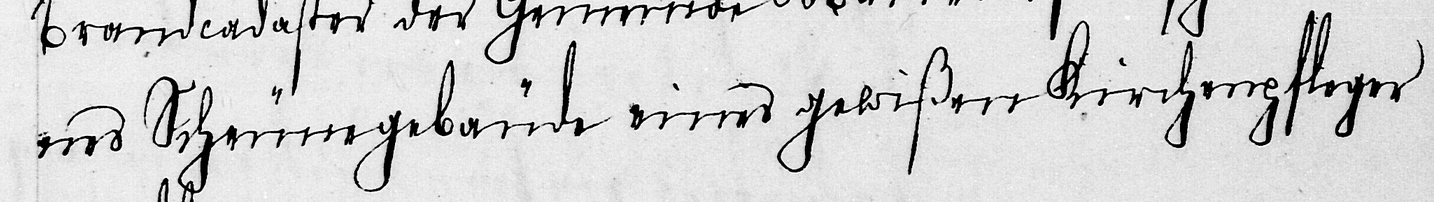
nes Scheunegebäude eines gewißen Kirchenpfleger
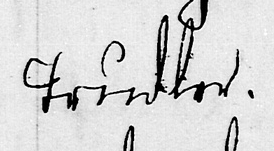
Trudler.
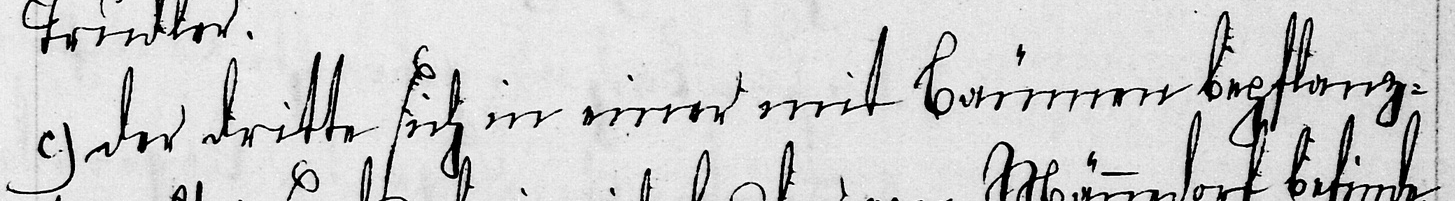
c.) Der Dritte sich in einer mit Bäumen bepflanz¬
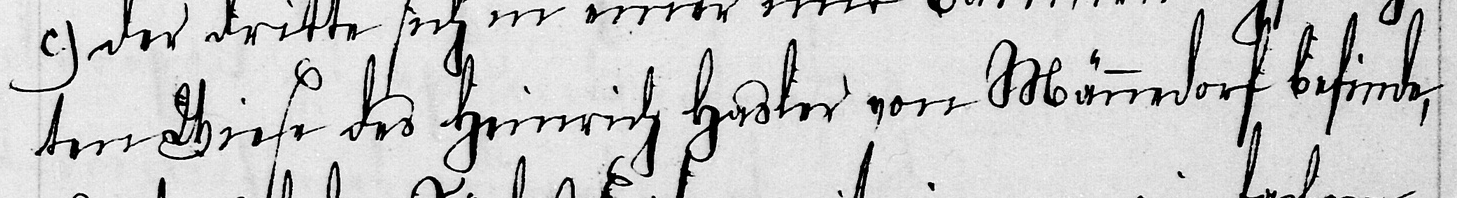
ten Wiese des Heinrich Hasler von Männedorf befinde,
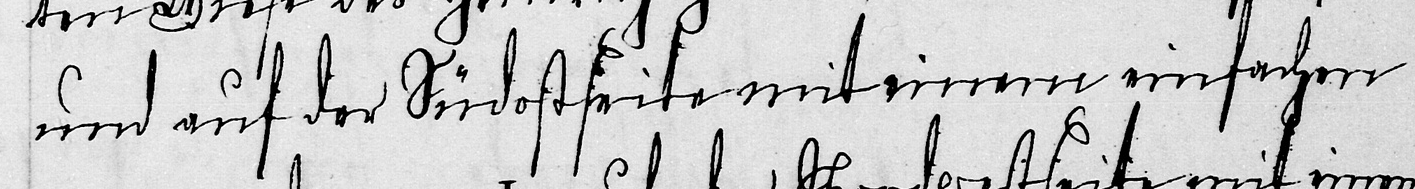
und auf der Südostseite mit einem einfachen
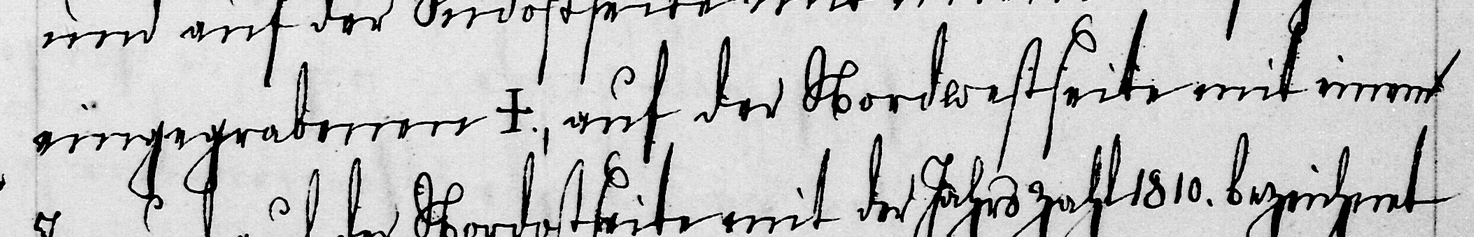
eingegrabenen +., auf der Nordwestseite mit einem
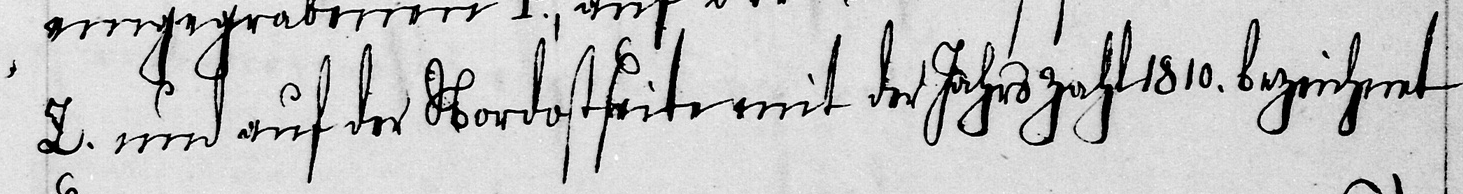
Z. und auf der Nordostseite mit der Jahreszahl 1810 bezeichn¬
